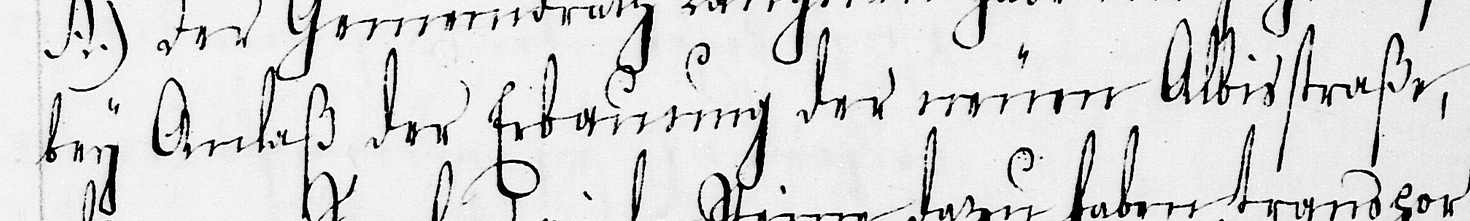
bey Anlaß der Erbauung der neuen Albisstraße,
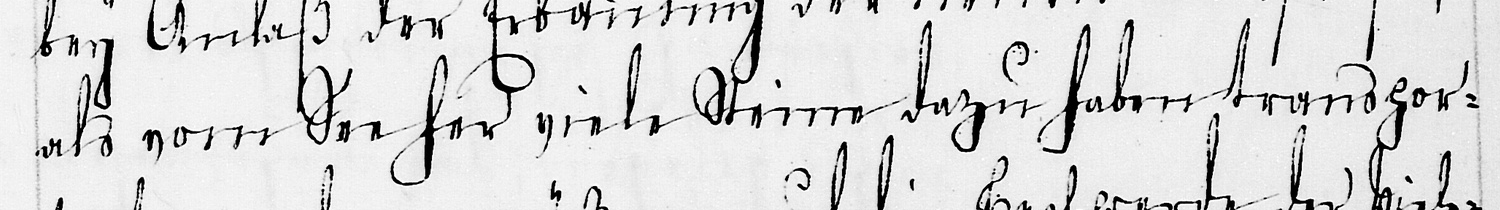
als vom See her viele Steine dazu haben transpor¬
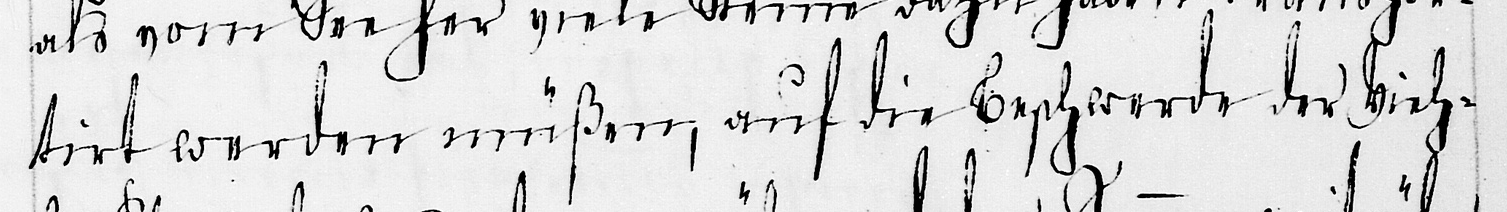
tirt werden müßen, auf die Beschwerde der Vieh¬
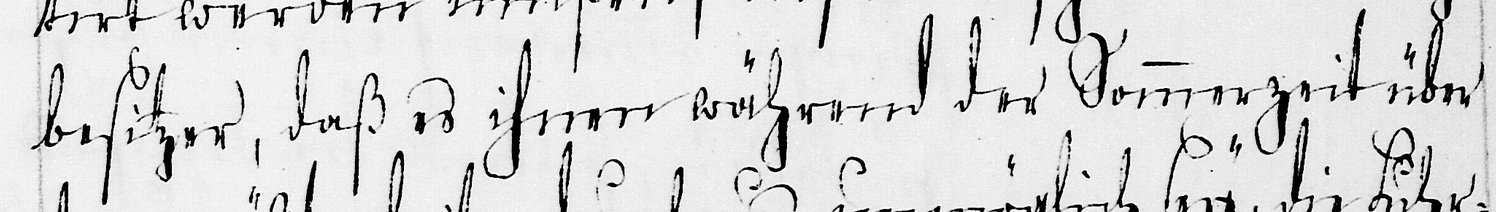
besitzer, daß es ihnen während der Sommerzeit über
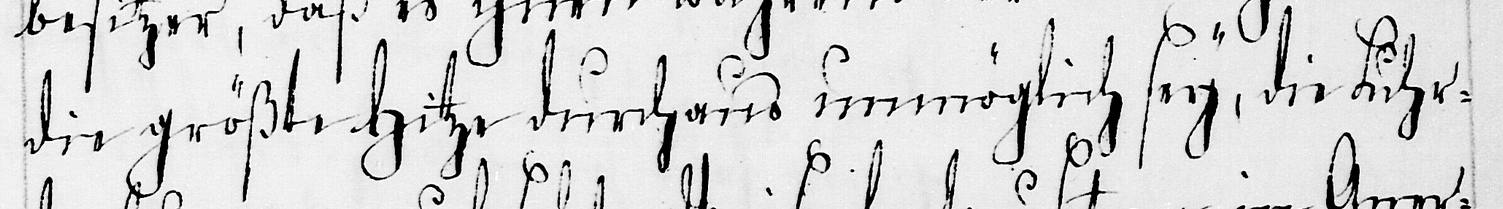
die größte Hitze durchaus unmöglich sey, die Fuhr¬
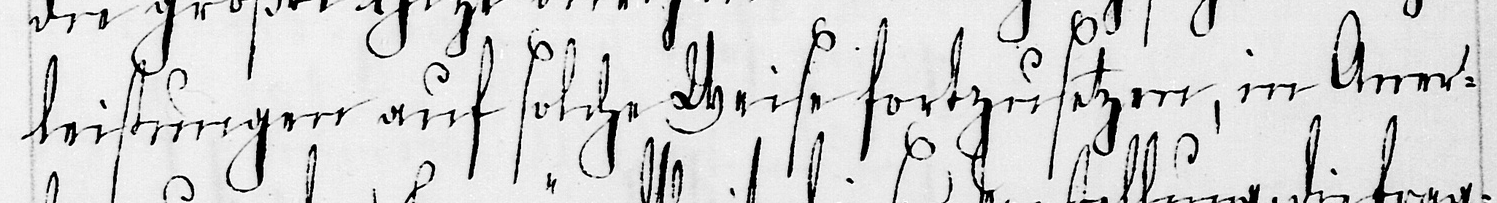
leistungen auf solche Weise fortzusetzen, in Aner¬
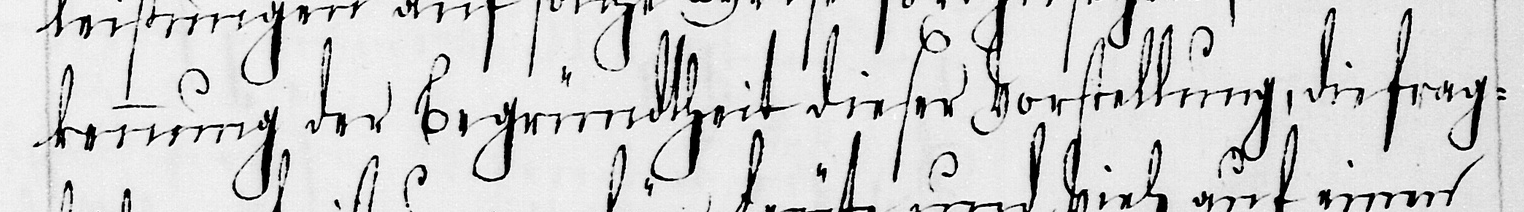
kennung der Begründtheit dieser Vorstellung, die frag¬
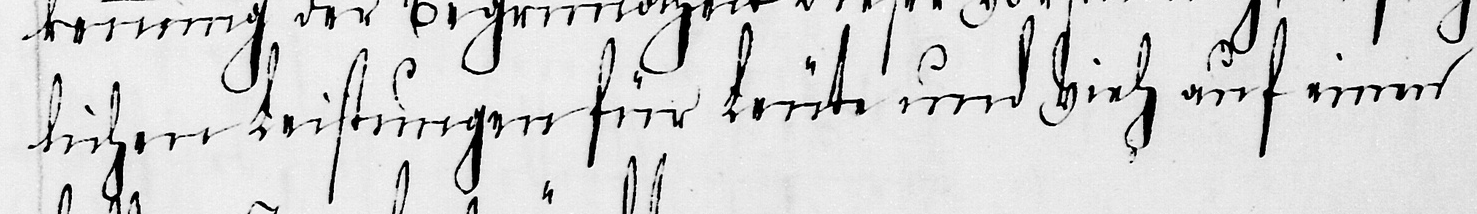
lichen Leistungen für Leute und Vieh auf einen
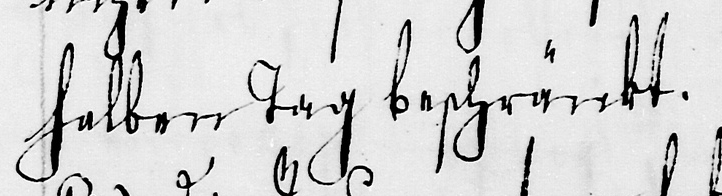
halben Tag beschränkt.
